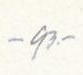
93
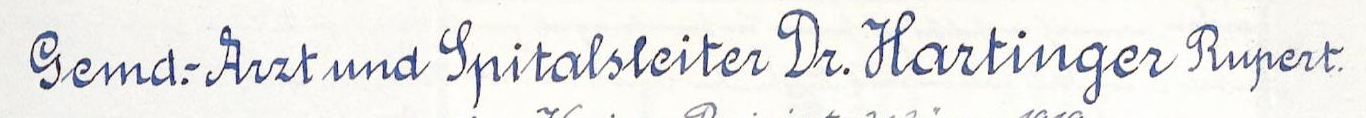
Gemd.-Arzt und Spitalsleiter Dr. Hartinger Rupert
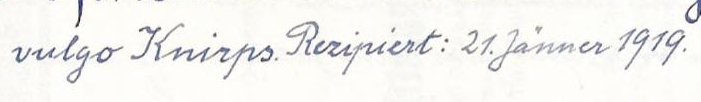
vulgo Knirps Rezipert: 21. Jänner 1919
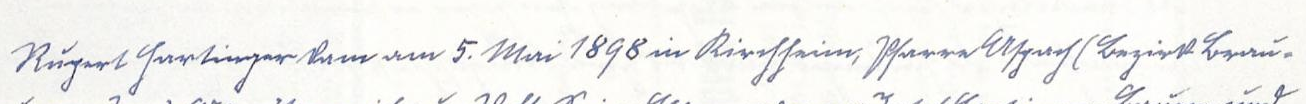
Rugert Hartinger kam am 5. Mai 1898 in Kirchheim, Pfarre Aspach(Bezirk Brau-
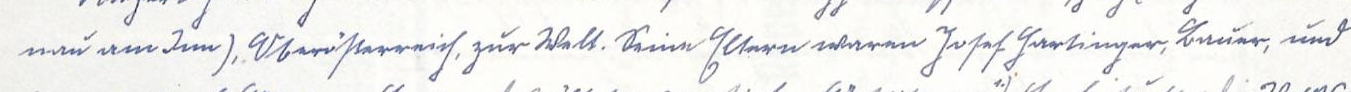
nau am Inn ). Oberösterreich, zur Welt. Seine Eltern waren Josef Hartinger, Bauer, und
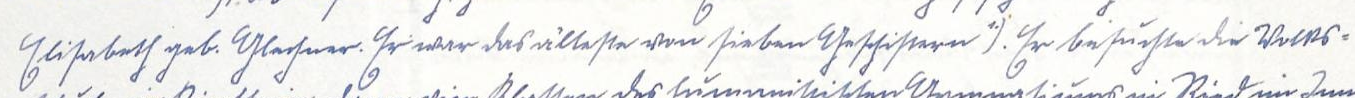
Elisabeth geb. Glechner. Er war das älteste von sieben Geschwistern 1). Er besuchte die Volks-
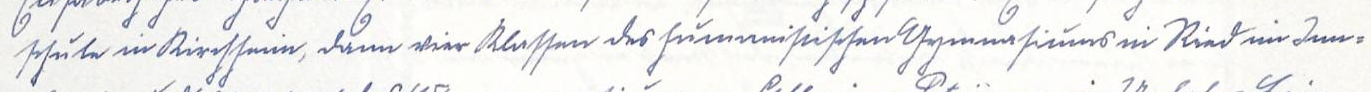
schule in Kirchhein, dann vier Klassen des hummistischen Gymnasiums in Ried im Inn-
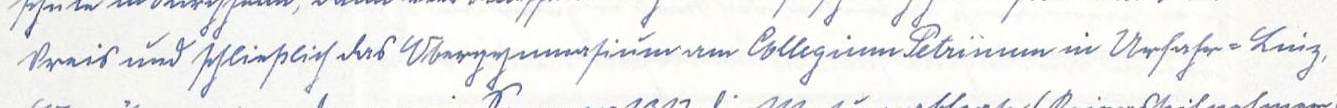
kreis und schließlich das Obergymnasium am Collegiun Petrinum in Urfahr-Linz,
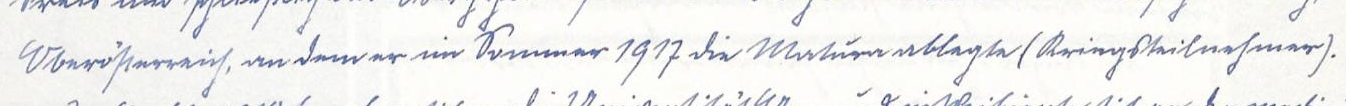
Oberösterreich, an dem er im Somnmer 1917 die Matura ablegte (Kriegsteilnehmer).
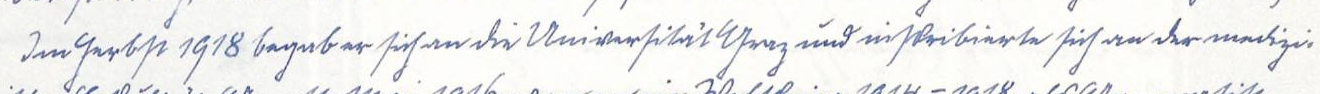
Im Herbst 1918 begab er sich an die Universität Graz und inskribierte sich an der medizi-
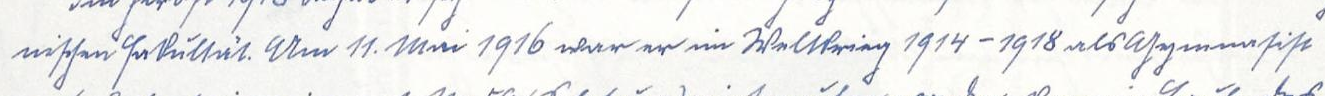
nischen Fakultät. Am 11. Mai 1916 war er im Weltkrieg 1914-1918 als Gymnasist
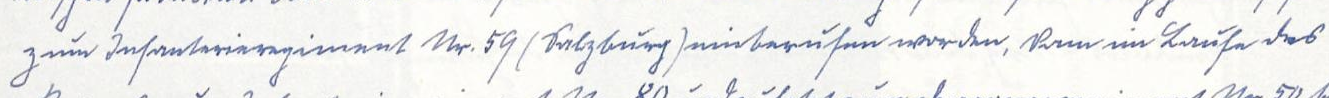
zum Infanterieregiment Nr. 59(Salzburg ) einberufen worden, kam im Laufe des
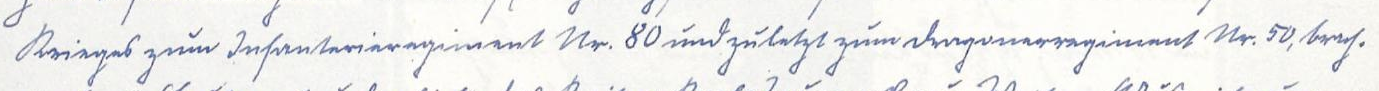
Krieges zum Infanterieregiment Nr. 80 und zuletzt zum Dragonerregiment Nr. 50, brach-
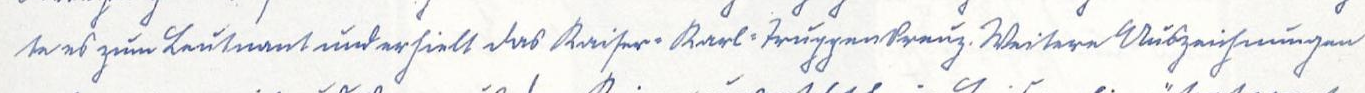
te es zum Leutnant und erhielt das Kaiser-Karl-Truppenkreuz. Weitere Auszeichnungen
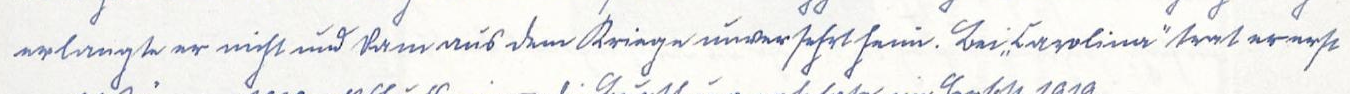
erlangte er nicht und kam aus dem Kriege unversehrt heim. Bei "Carolina" trat er erst
